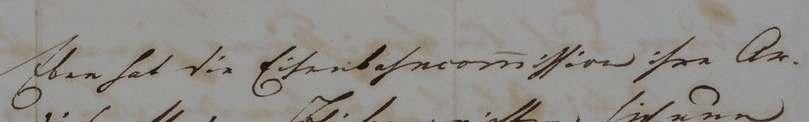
Eben hat die Eisenbahncommission ihre Ar-
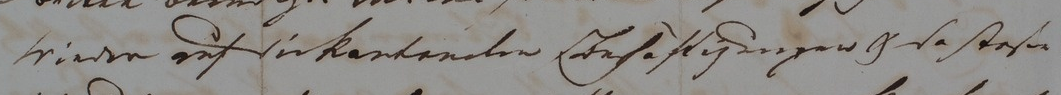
wieder auf die kantonalen Beschäftigungen & da stosse
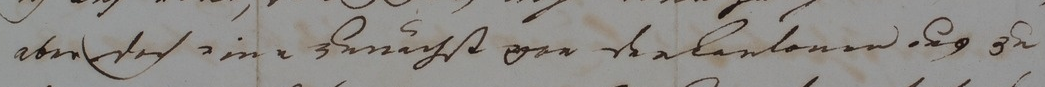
aber doch eine zunächst von den Cantonen aus zu
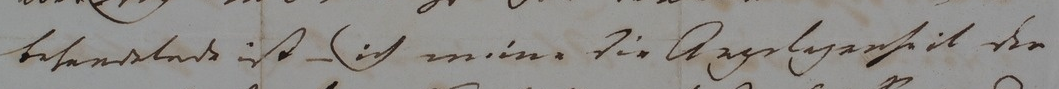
behandelnde ist – ich meine die Angelegenheit der
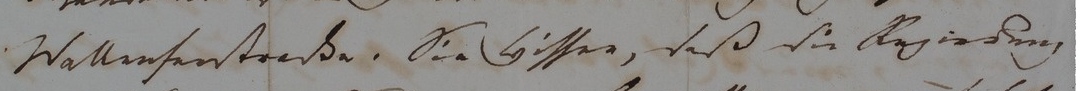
Wallenseestraße. Sie wissen, daß die Regierung
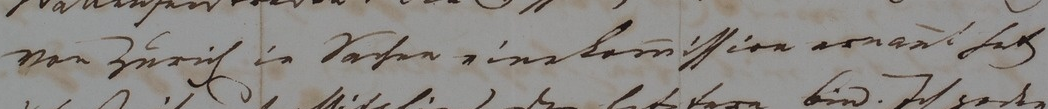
von Zürich in Sachen eine Commission ernannt hat
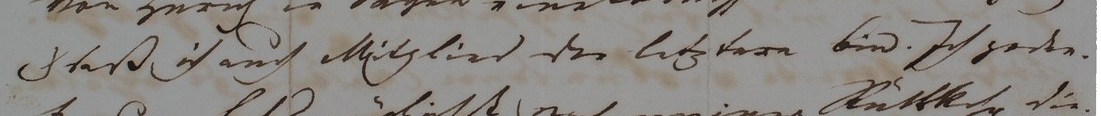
& daß ich auch Mitglied der letztern bin. Ich geden-
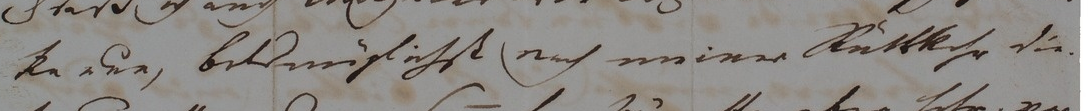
ke nun, baldmöglichst nach meiner Rückkehr, die-
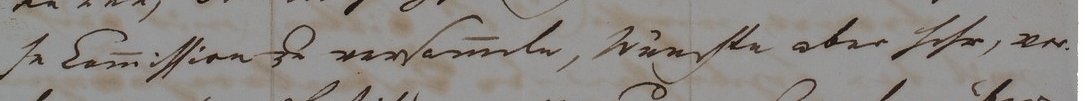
se Commission zu versammeln, wünschte aber sehr, vor-
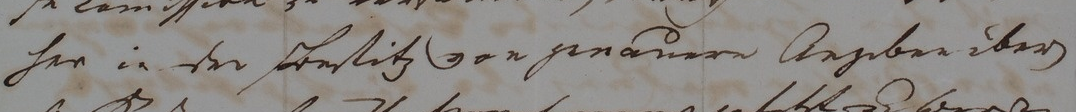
her in den Besitz von genauern Angaben über
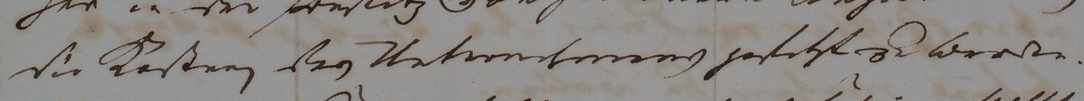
die Kosten des Unternehmens gesetzt zu werden.
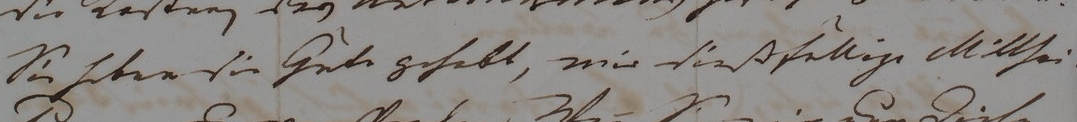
Sie haben die Güte gehabt, mir dießfällige Mitthei-
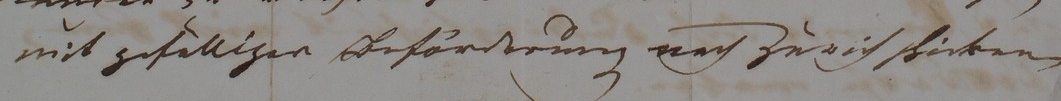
mit gefälliger Beförderung nach Zürich schicken
